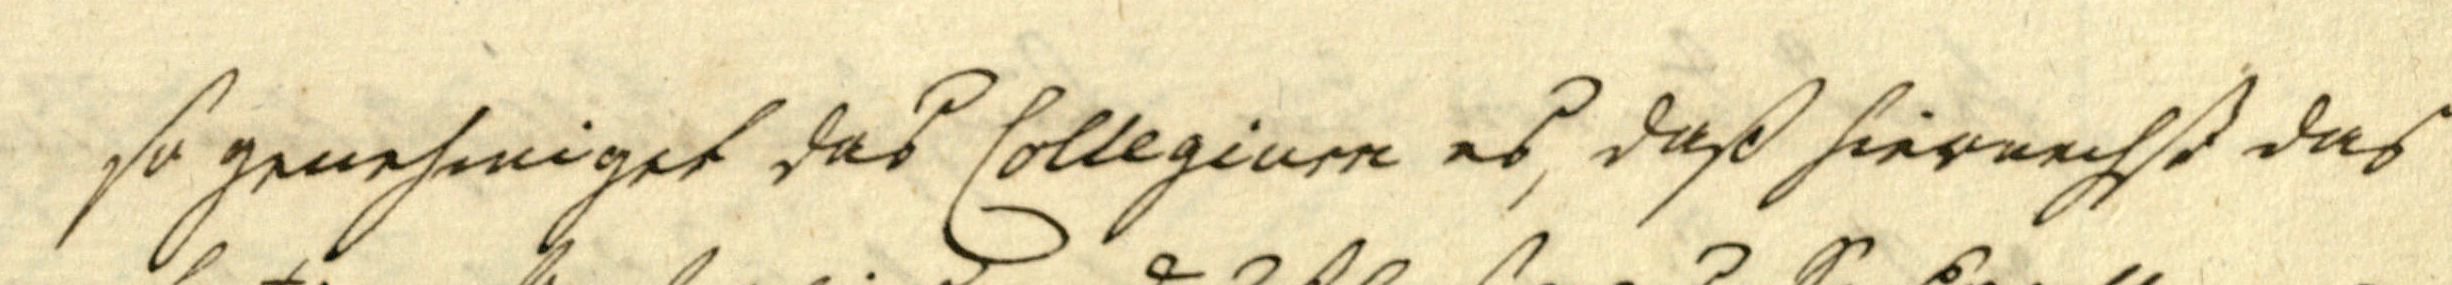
so genehmiget das Collegium es, daß hiernechst das
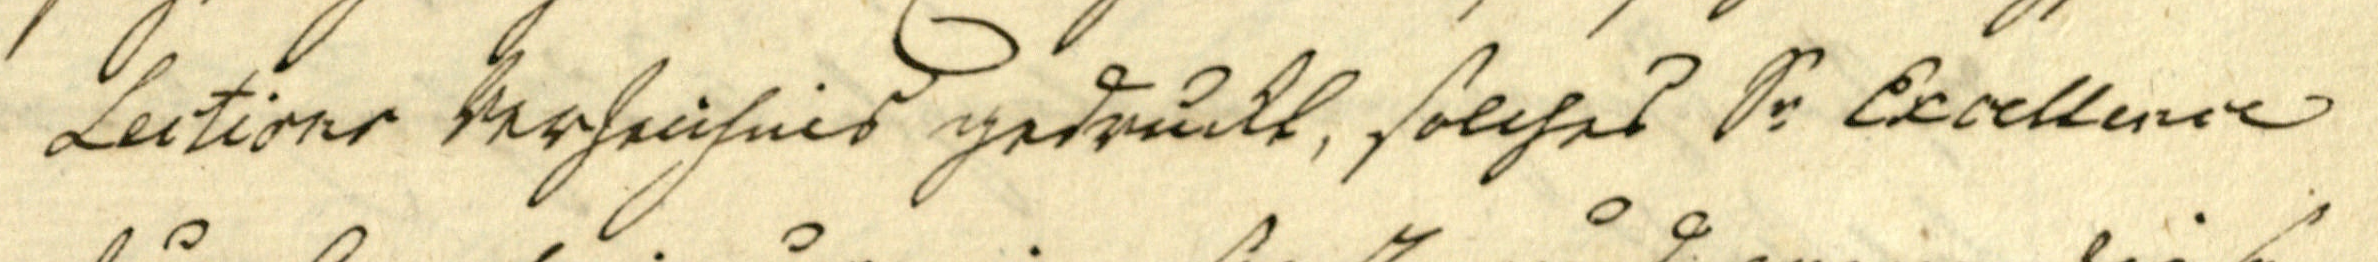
Lections Verzeichnis gedruckt, solches Sr Excellence
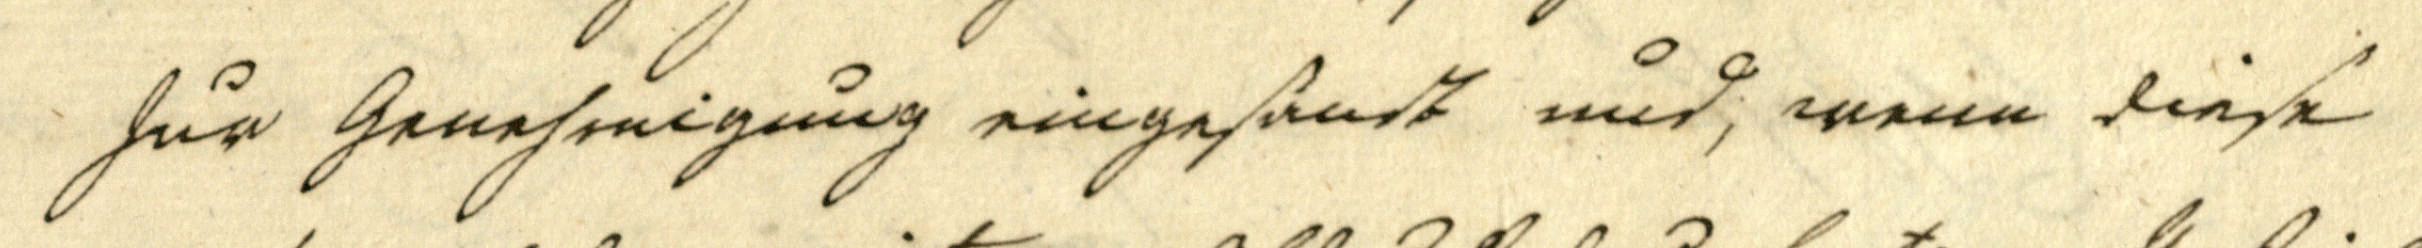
zur Genehmigung eingesandt und, wenn diese
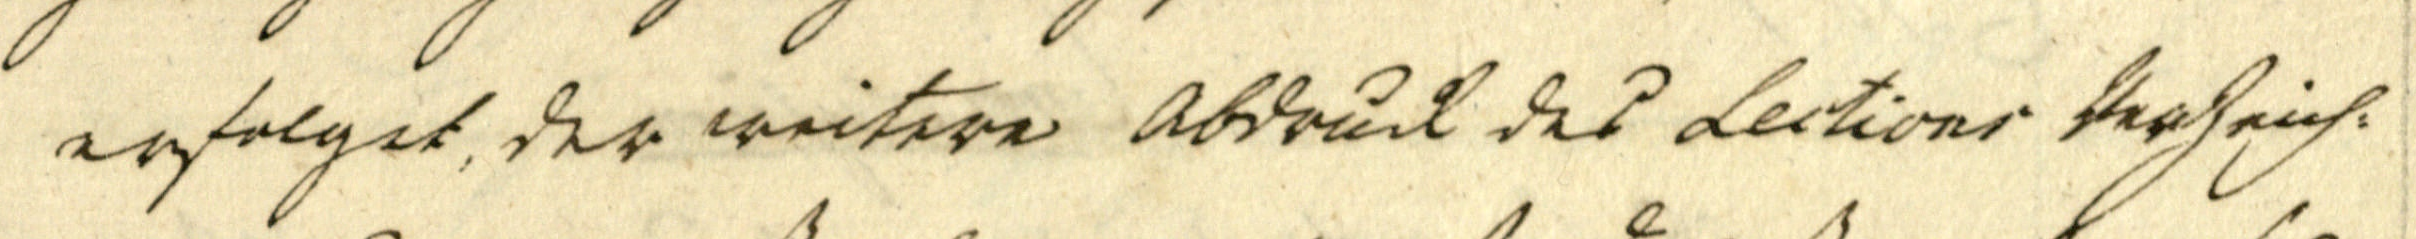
erfolget, der weitere Abdruck des Lections Verzeich¬
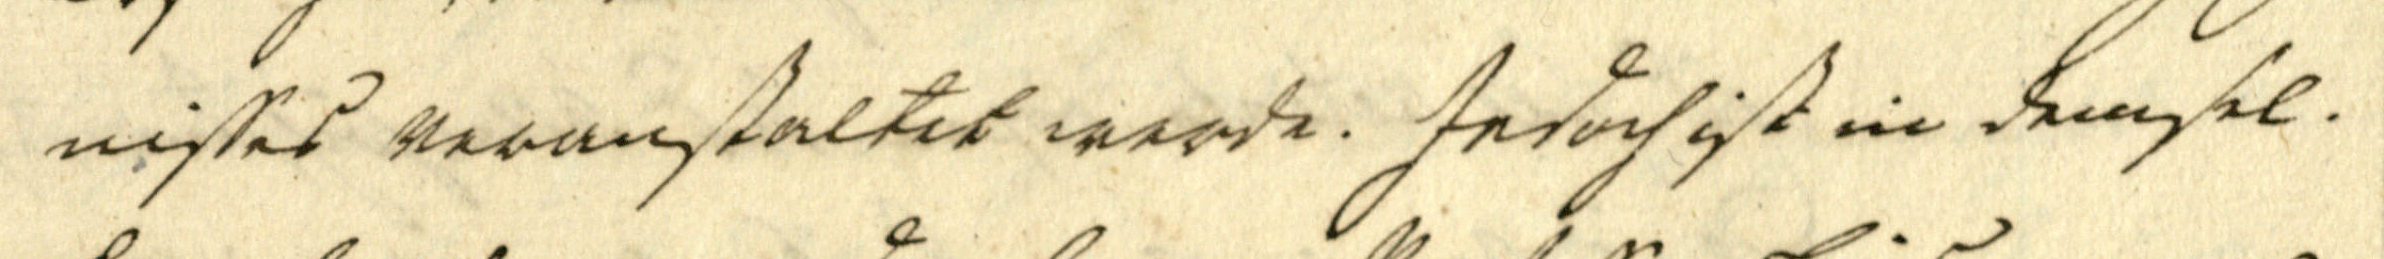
nisses veranstaltet werde. Jedoch ist in demsel¬
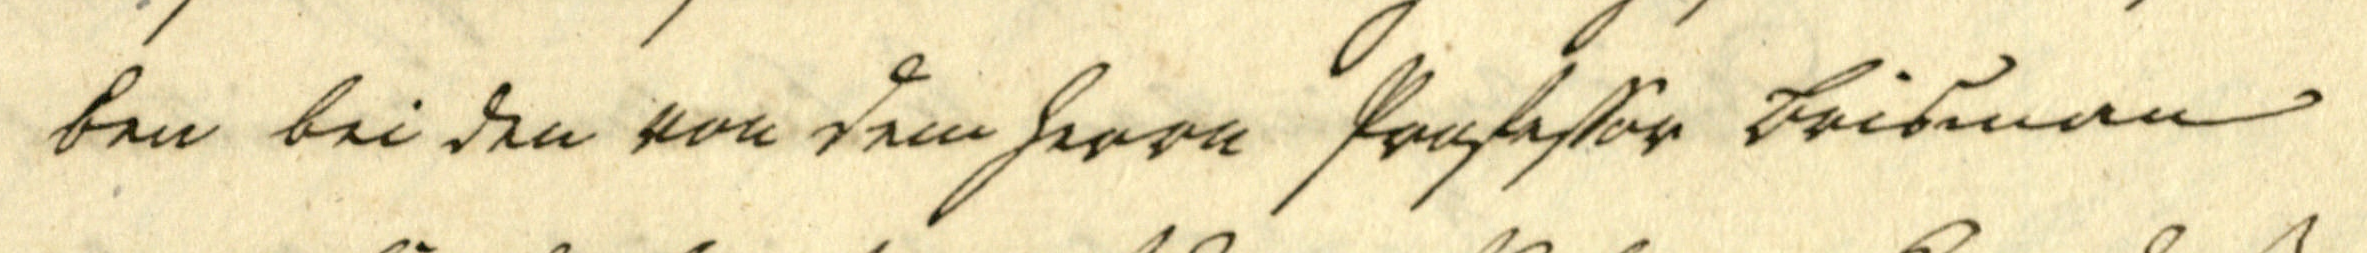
ben bei den von dem Herrn Professor Brisman
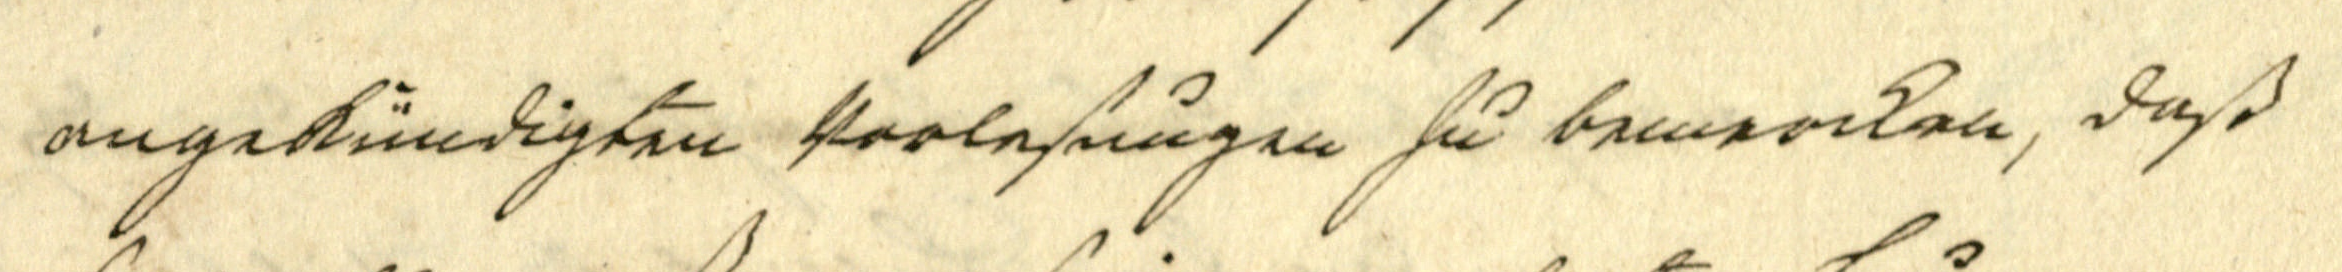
angekündigten Vorlesungen zu bemercken, daß
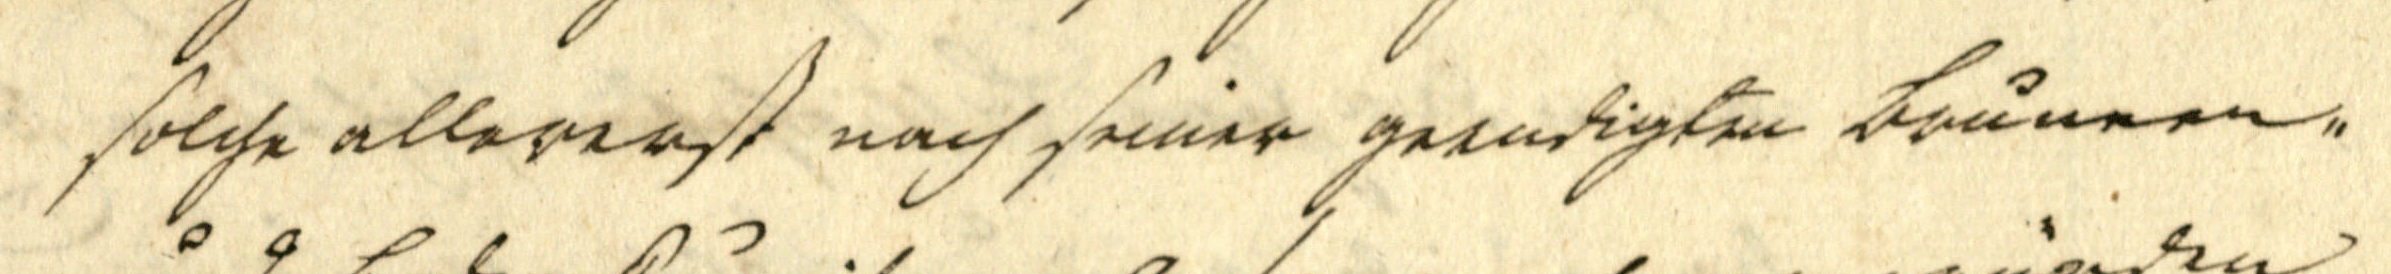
solche allererst nach seiner geendigten Brunnen¬
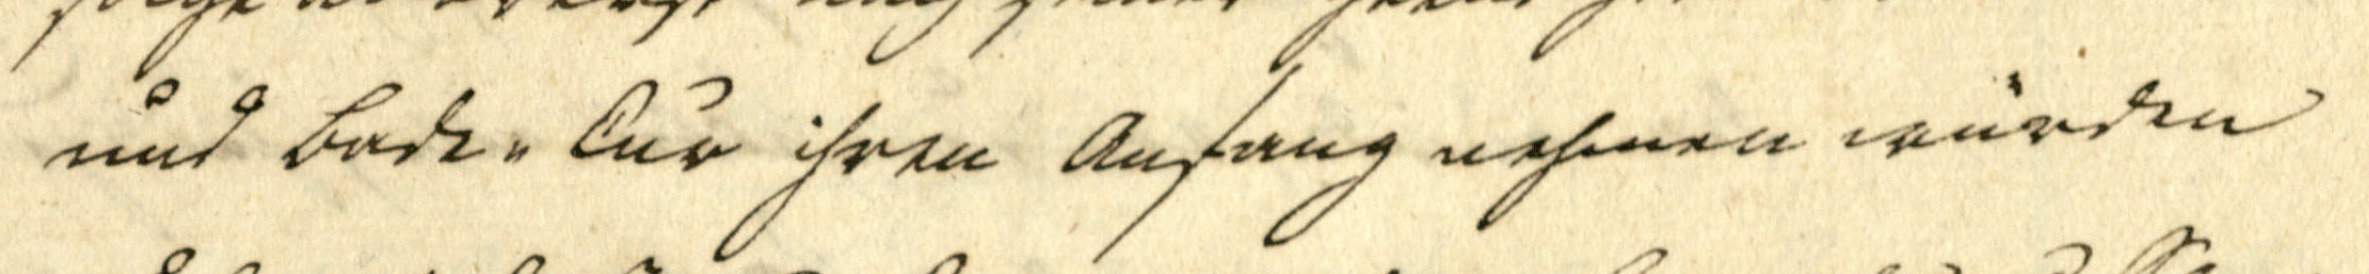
und Bade- Cur ihren Anfang nehmen würden
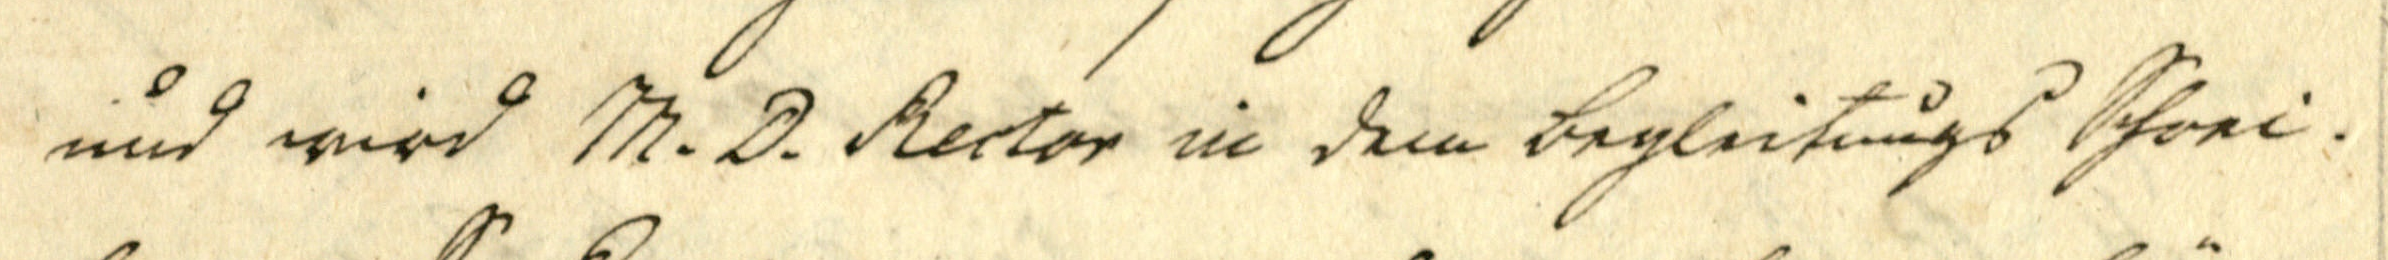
und wird M. D. Rector in dem Begleitungs Schrei¬
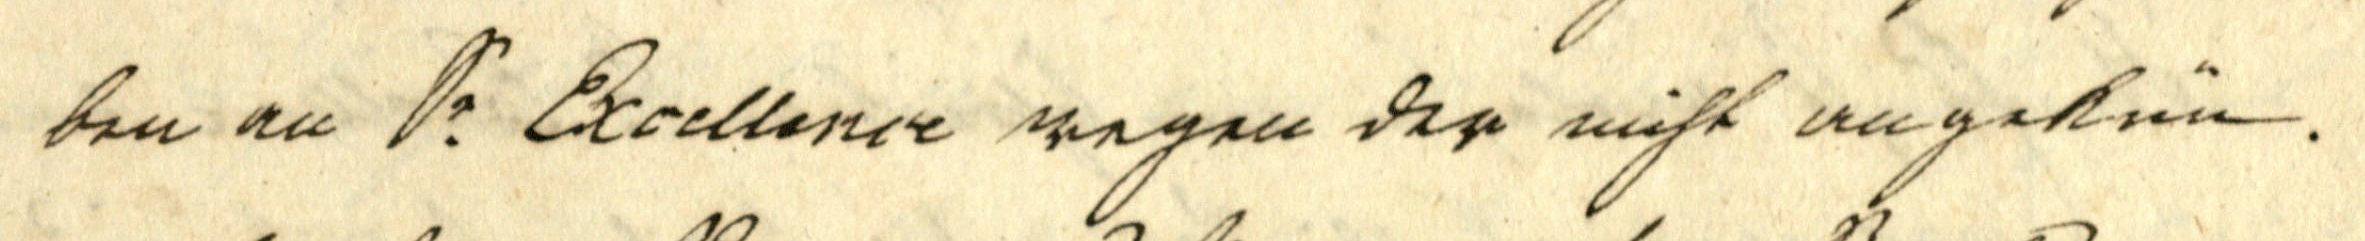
ben an Sr Excellence wegen der nicht angekün¬
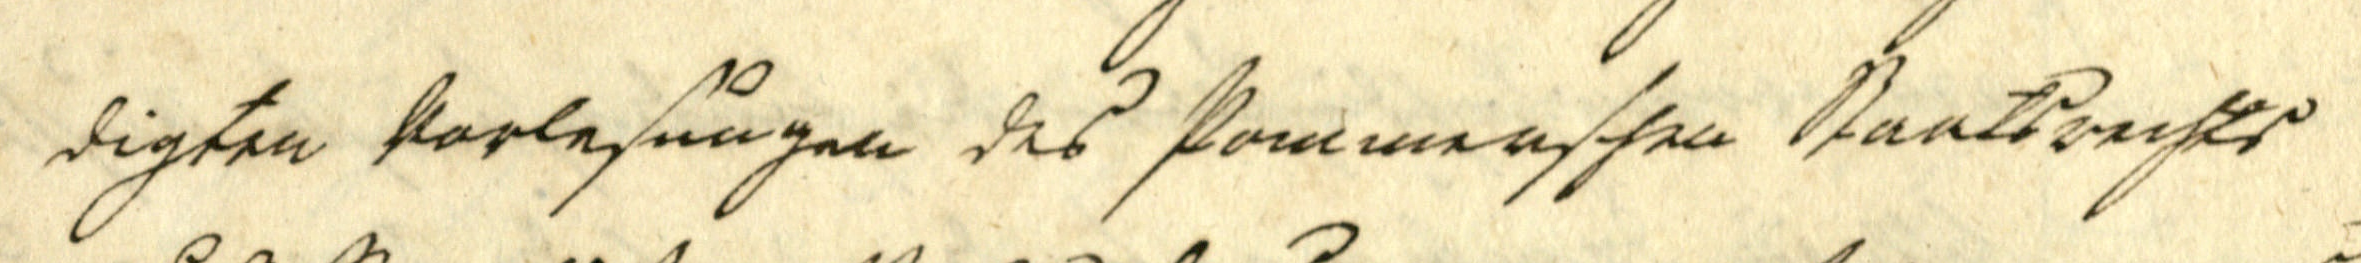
digten Vorlesungen des Pommerschen Staatsrechts
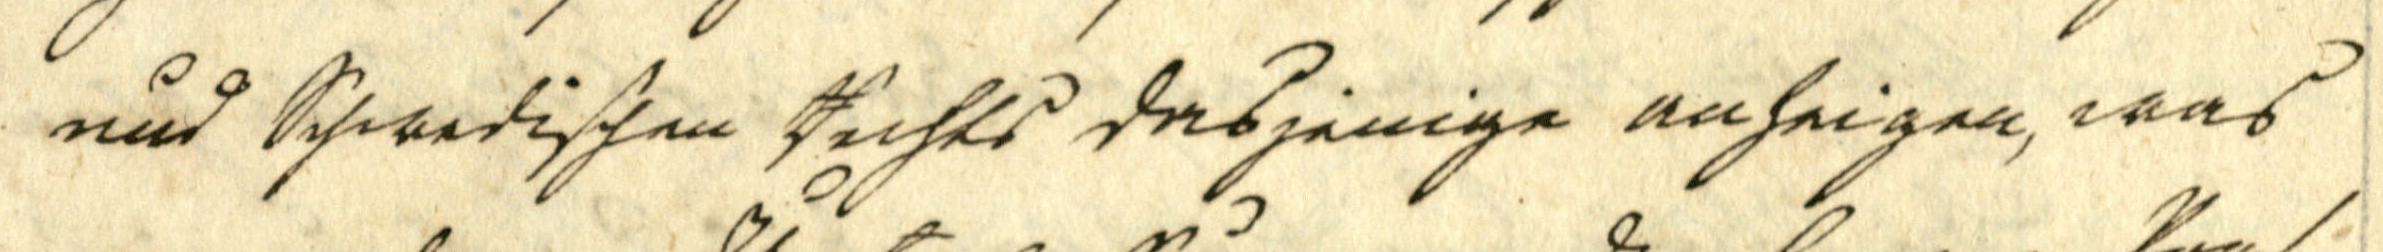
und Schwedischen Rechts dasjenige anzeigen, was
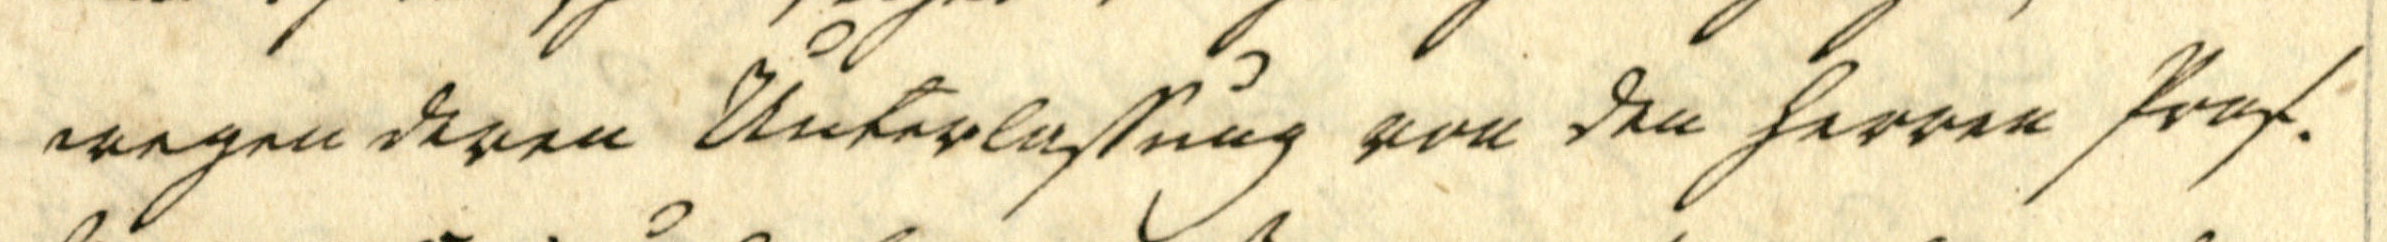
wegen deren Unterlassung von den Herren Prof.
